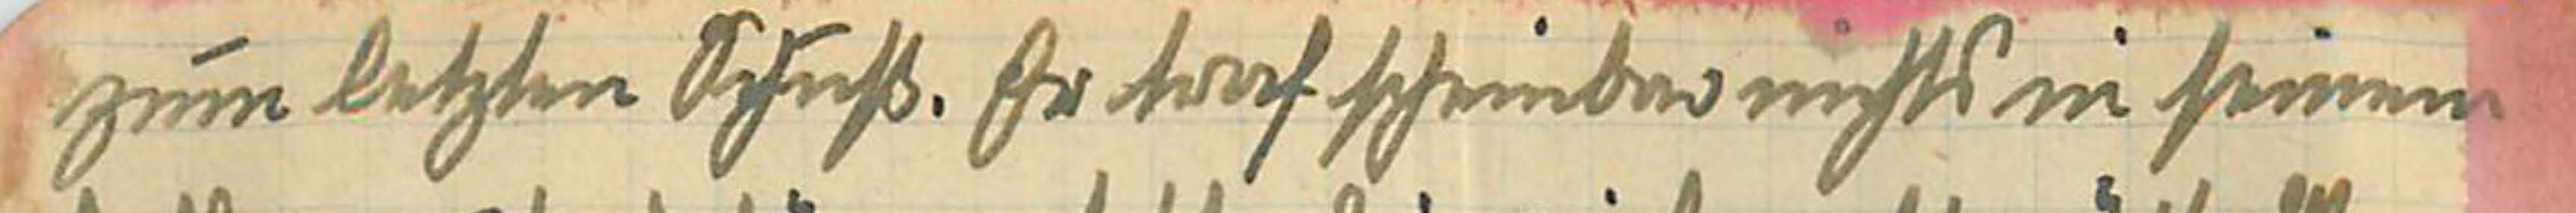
zum letzten Schuß. Er traf scheinbar nichts in seinem
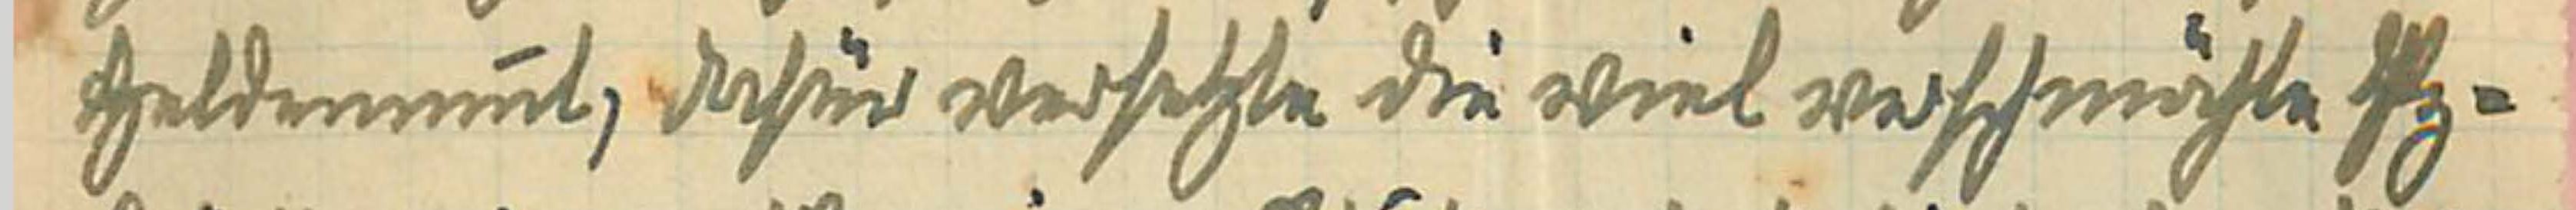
Heldenmut, dafür versetzte die viel verschmähte Pz-
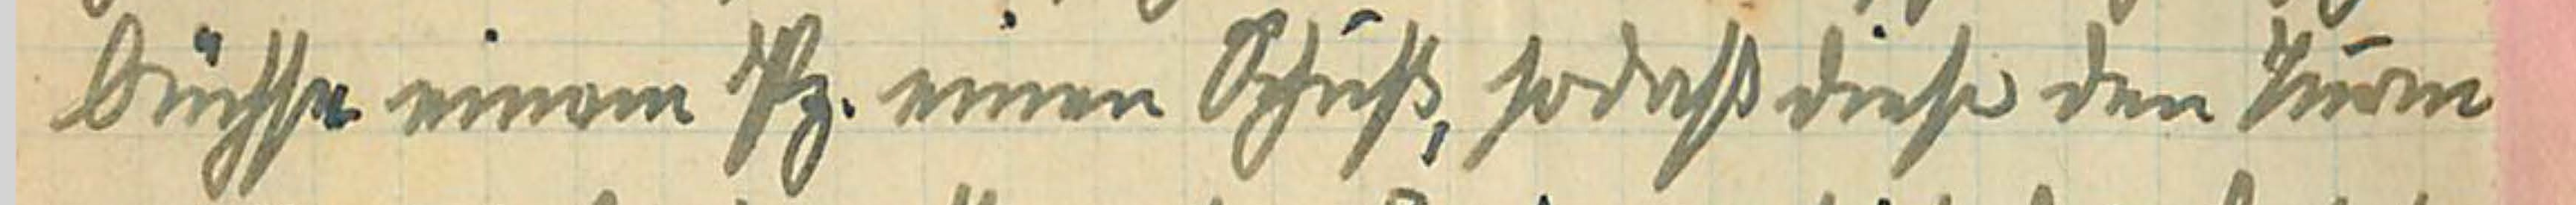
büchse einem Pz. einen Schuß, sodaß dieser den Turm
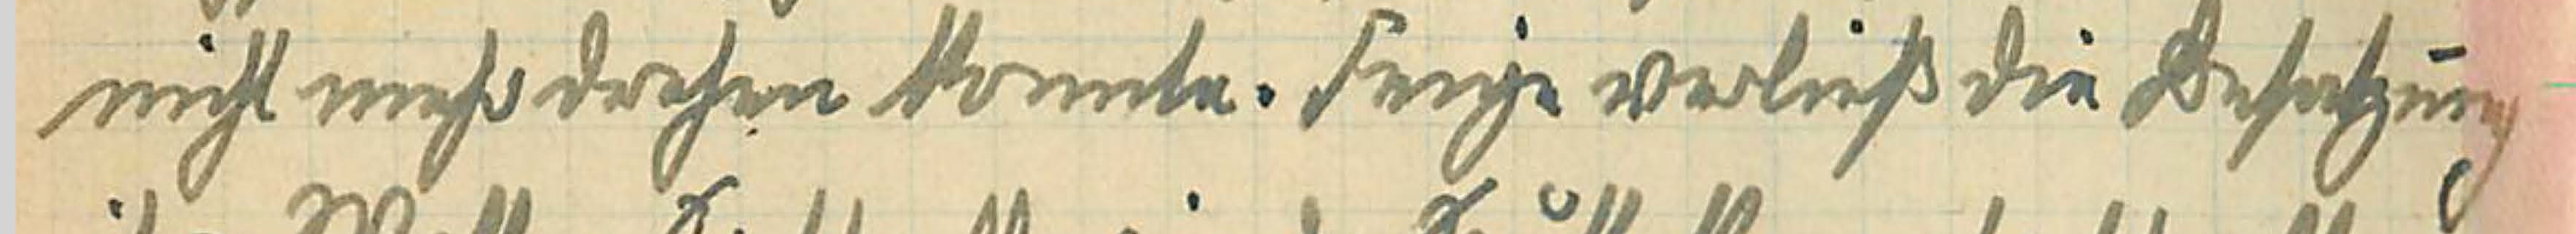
nicht mehr drehen konnte. Feige verließ die Besatzung
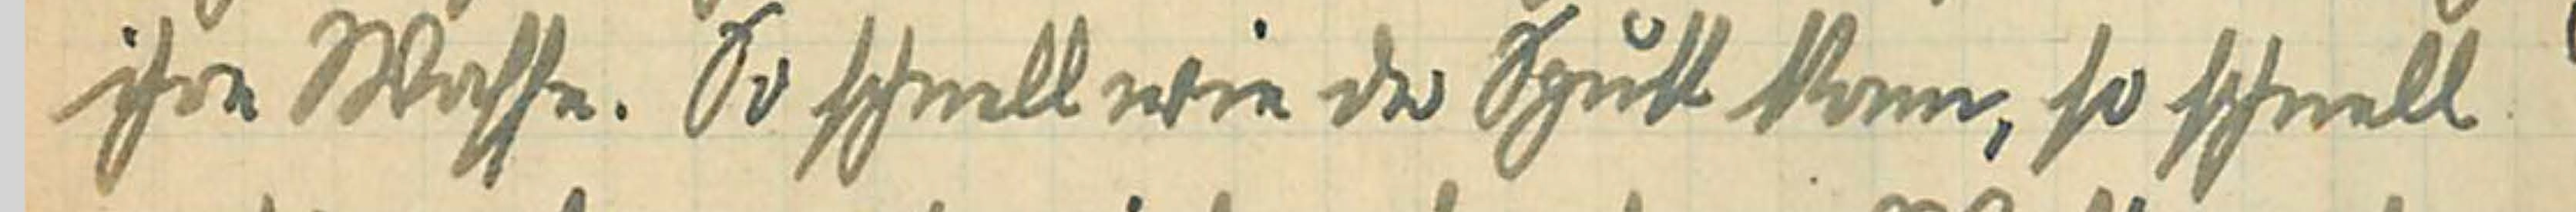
ihre Waffe. So schnell wie der Spuk kam, so schnell
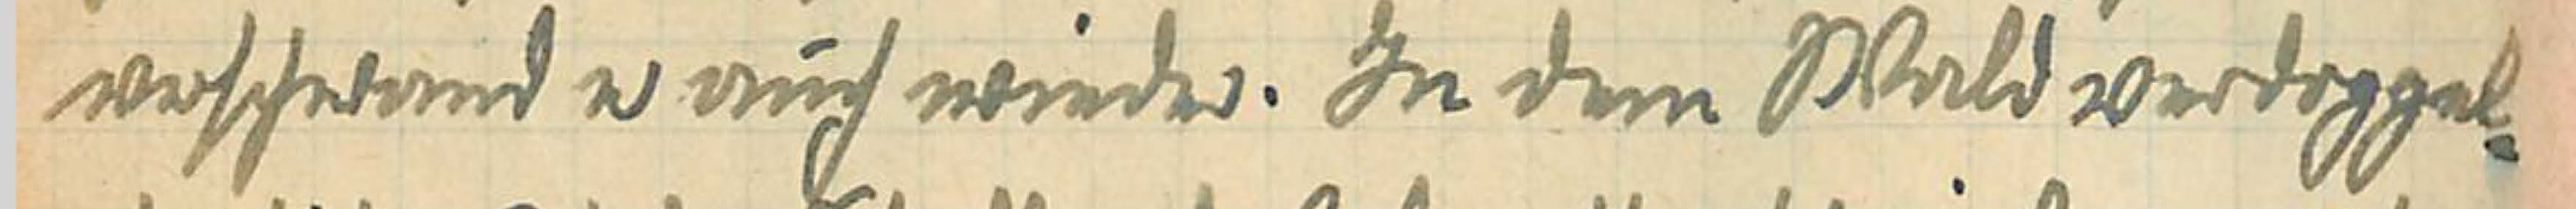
verschwand er auch wieder. In dem Wald verdoppel-
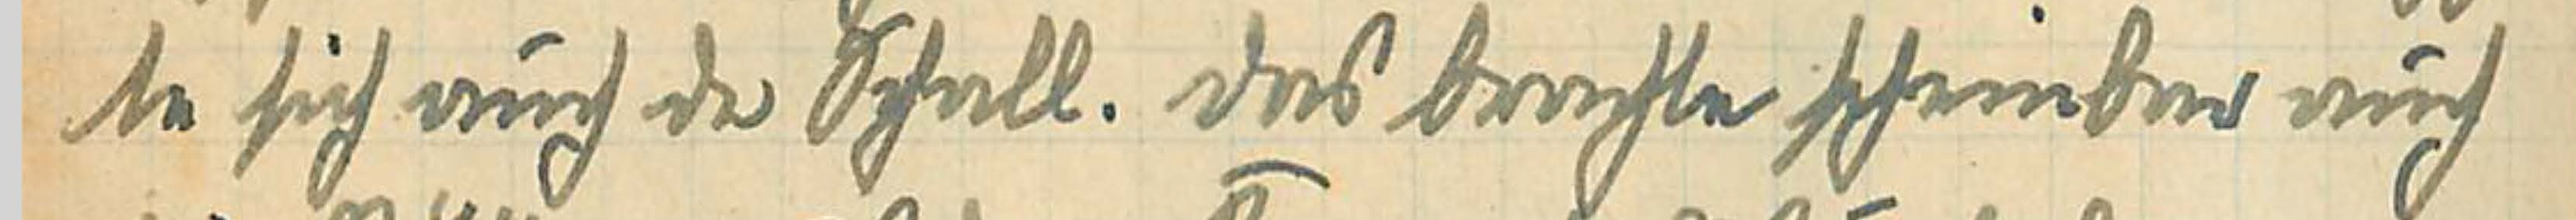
te sich auch der Schall. Das brachte scheinbar auch
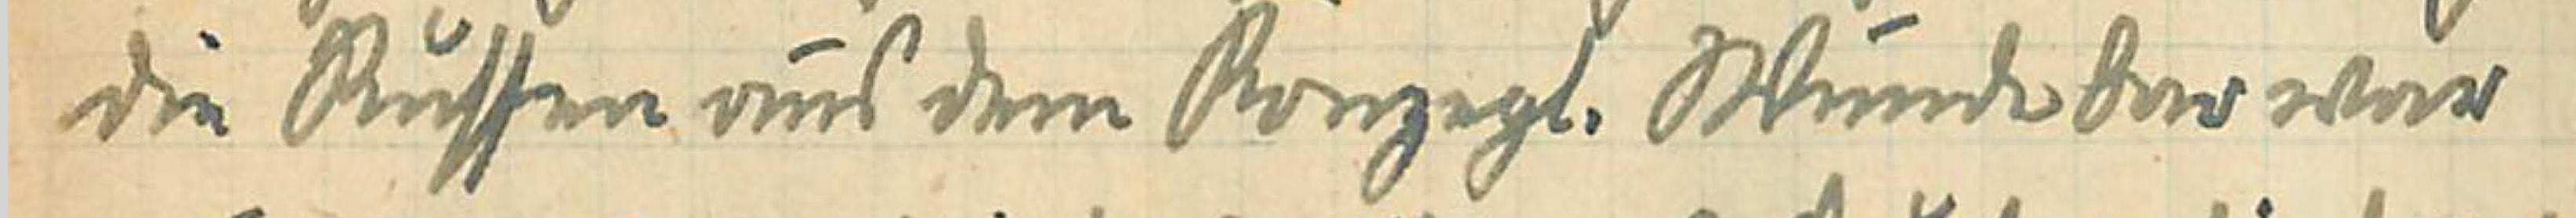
die Russen aus dem Konzept. Wunderbar war
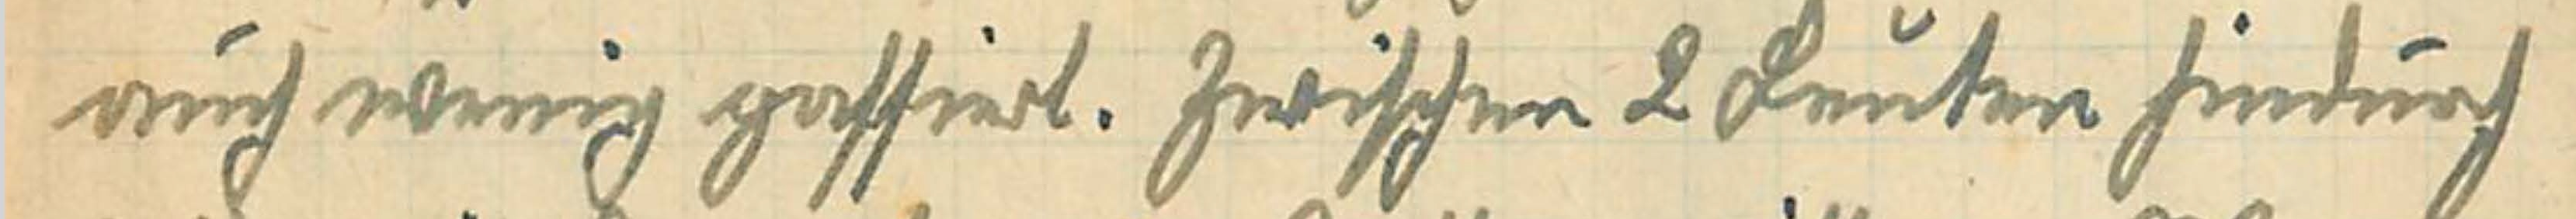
auch wenig passiert. Zwischen 2 Leuten hindurch
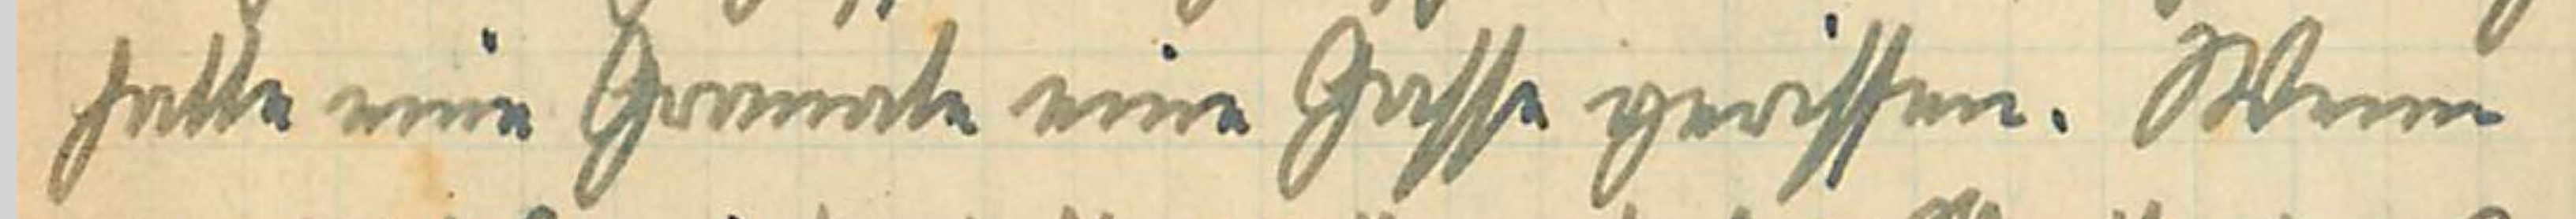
hatte eine Granate eine Gasse gerissen. Wenn
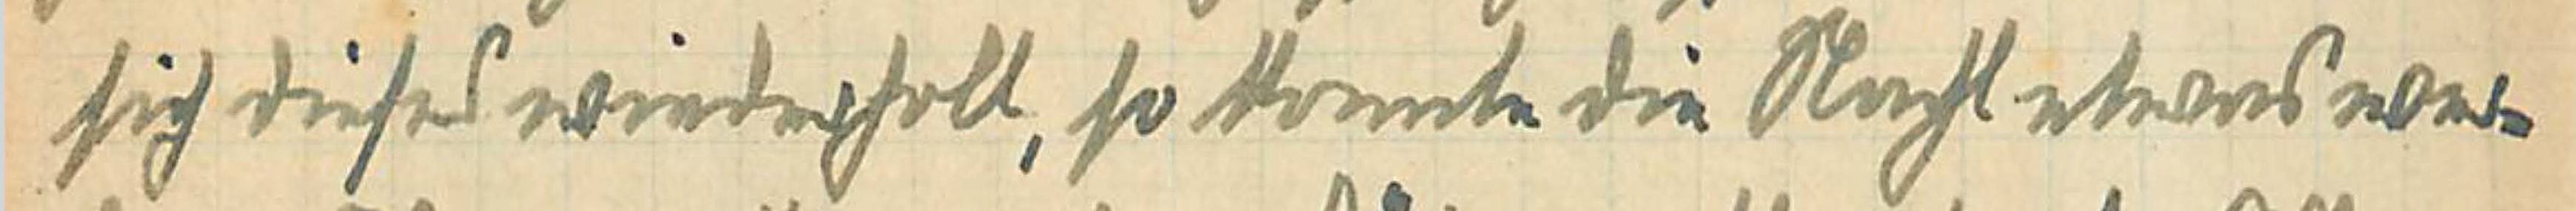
sich dieses wiederholt, so konnte die Nacht etwas wer-
